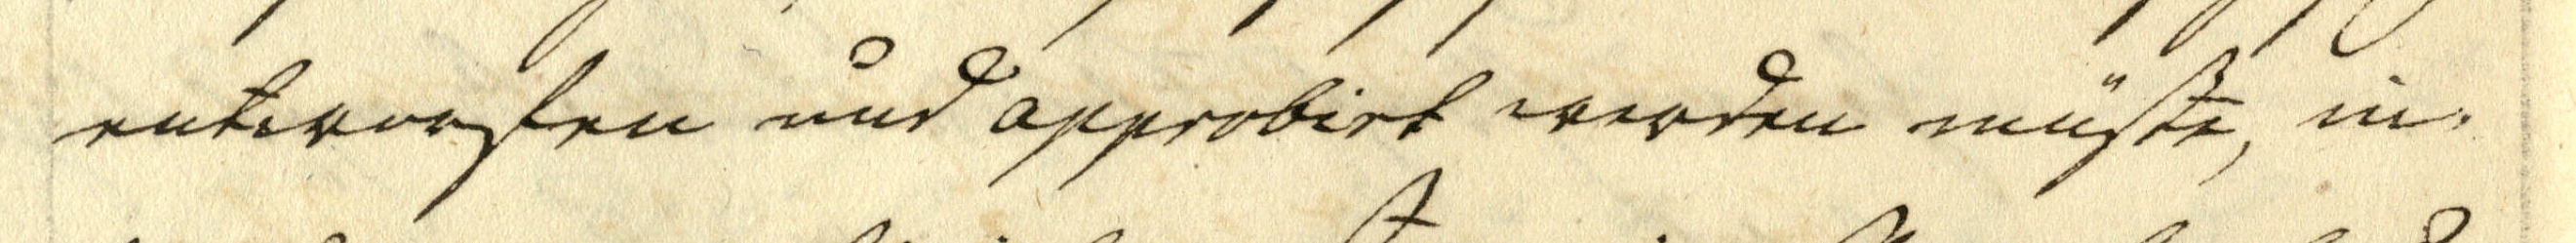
entworfen und approbirt werden müßte, in¬
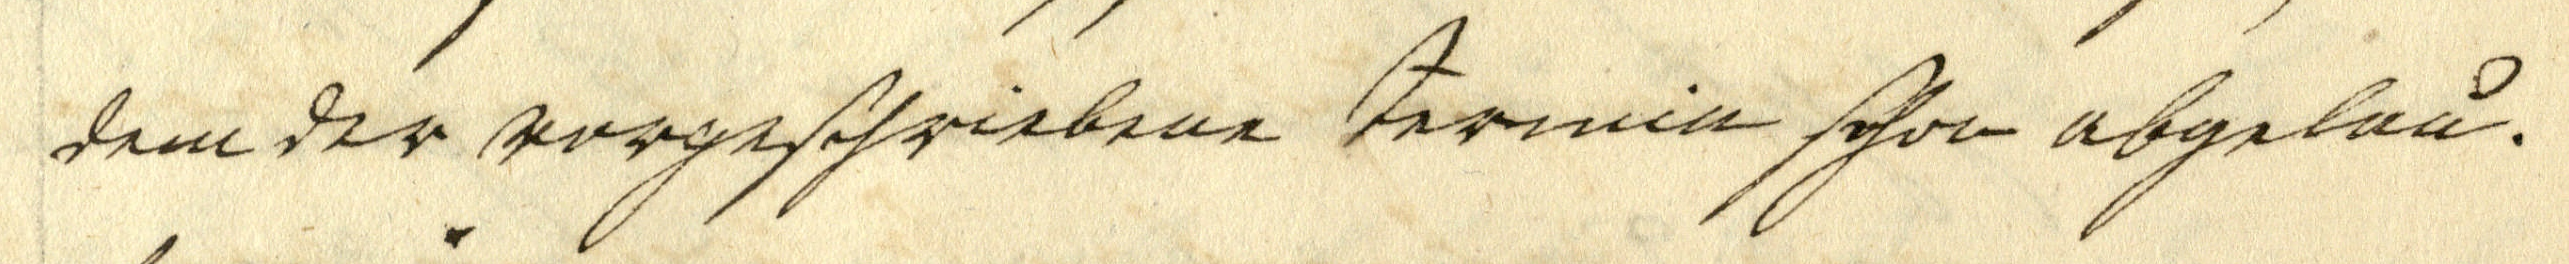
dem der vorgeschriebene Termin schon abgelau¬
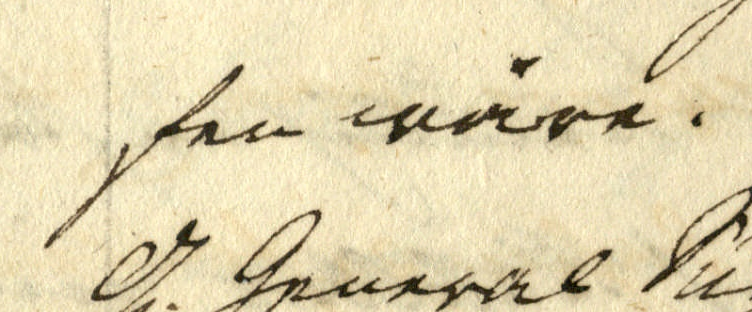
fen wäre.
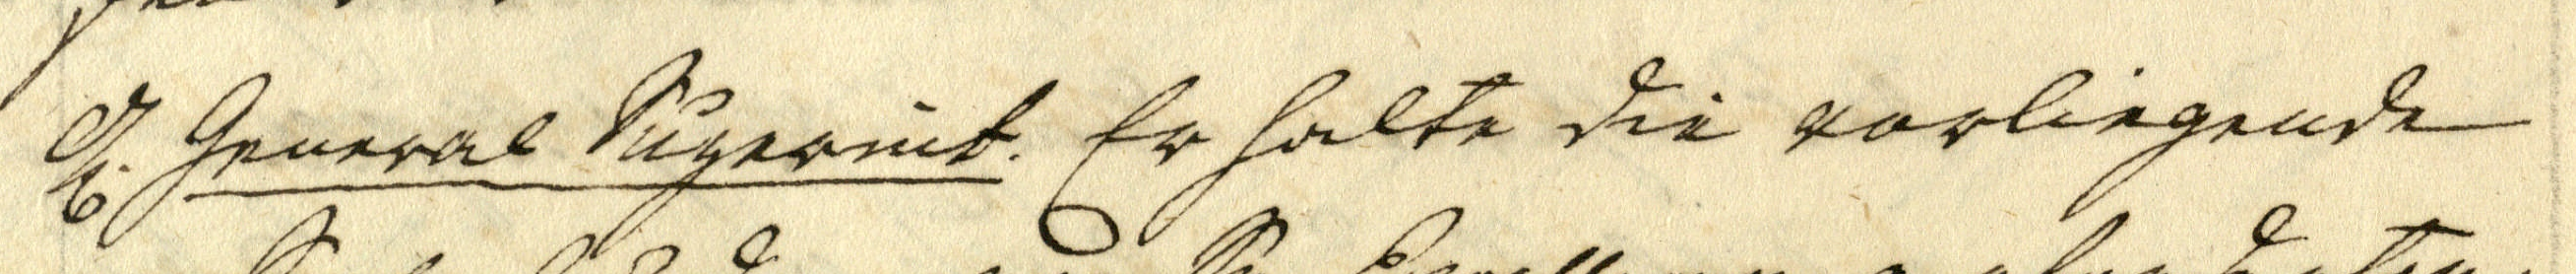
dh. General Superint. Er halte die vorliegende
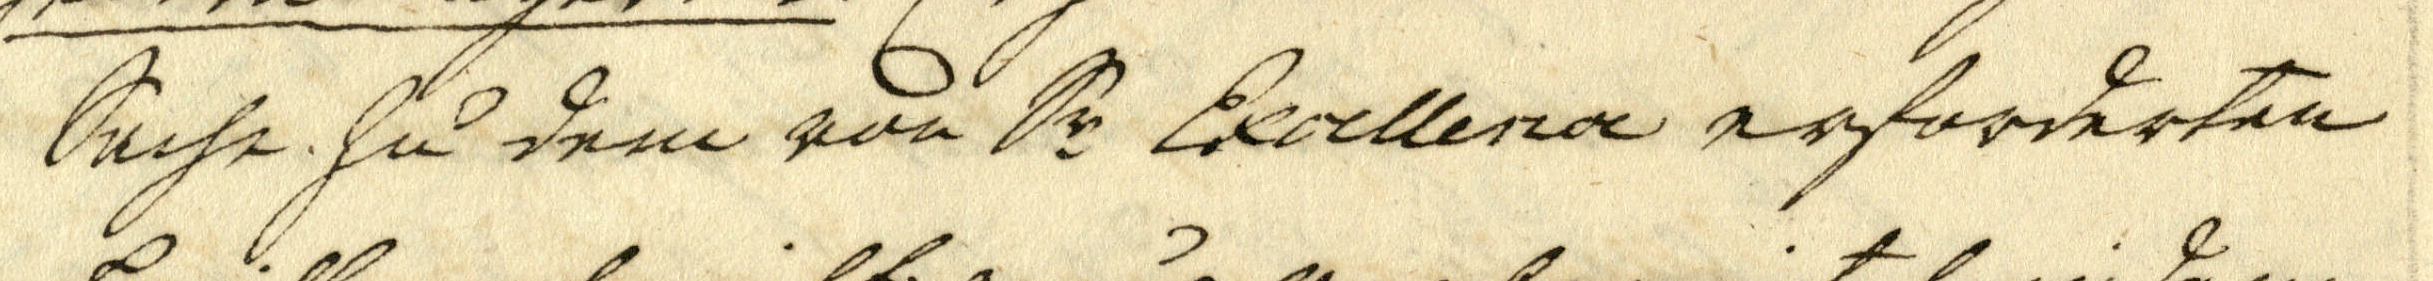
Sache zu dem von Sr. Excellence erforderten
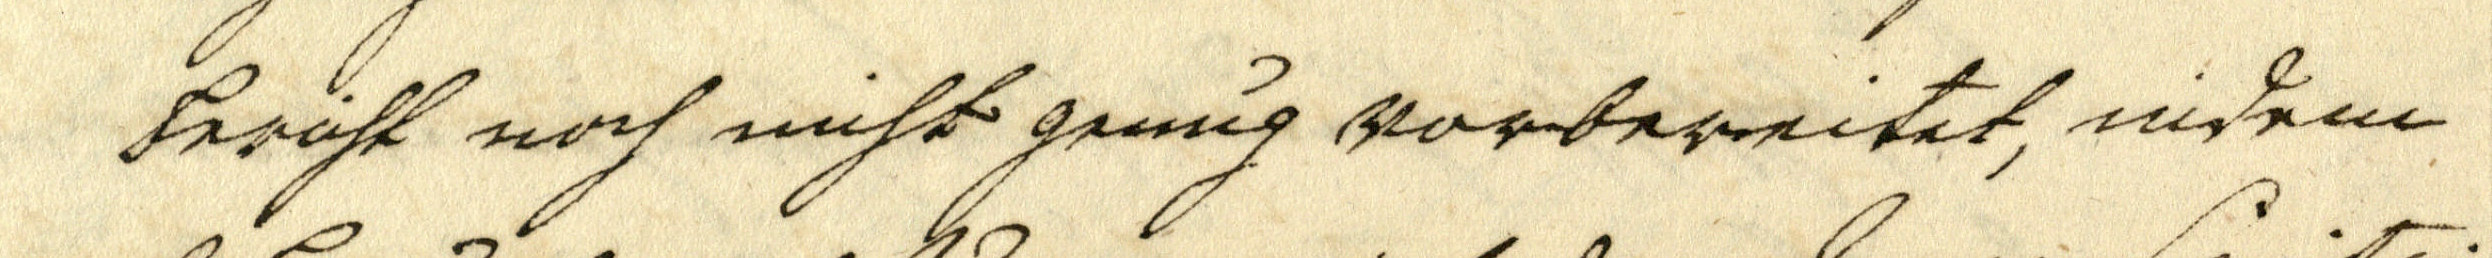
Bericht noch nicht genug vorbereitet, indem
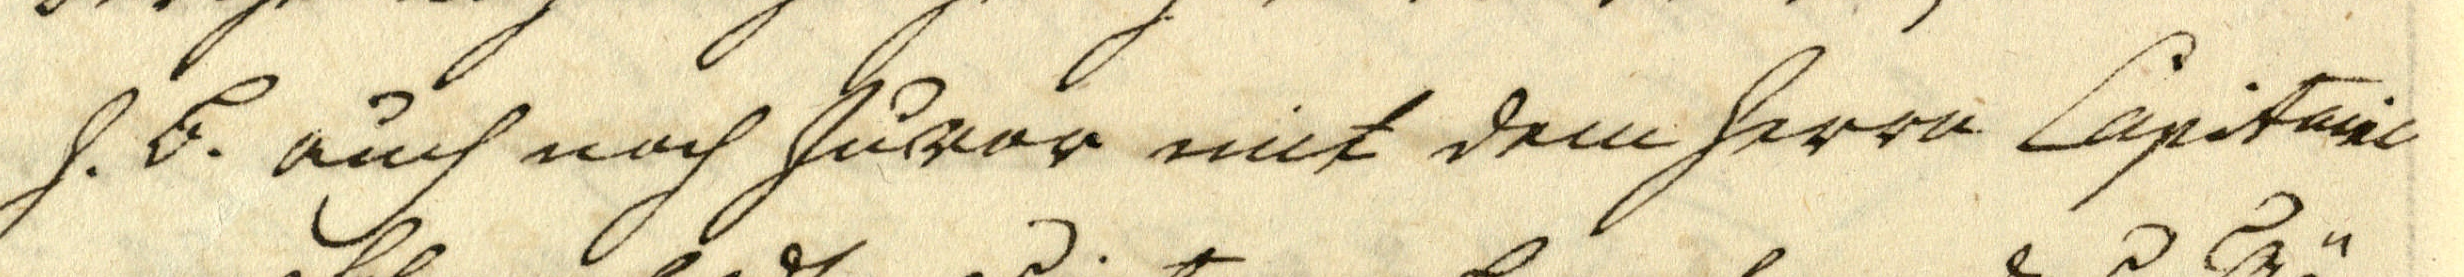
z. B. auch noch zuvor mit dem Herrn Capitaine
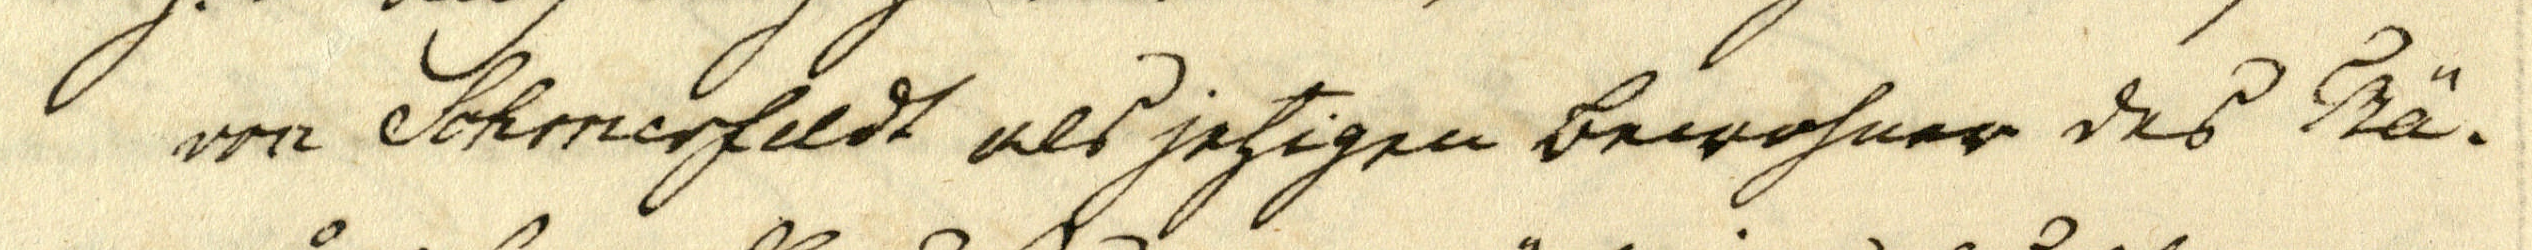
von Schmerfeldt als jetzigen Bewohner des Trä¬
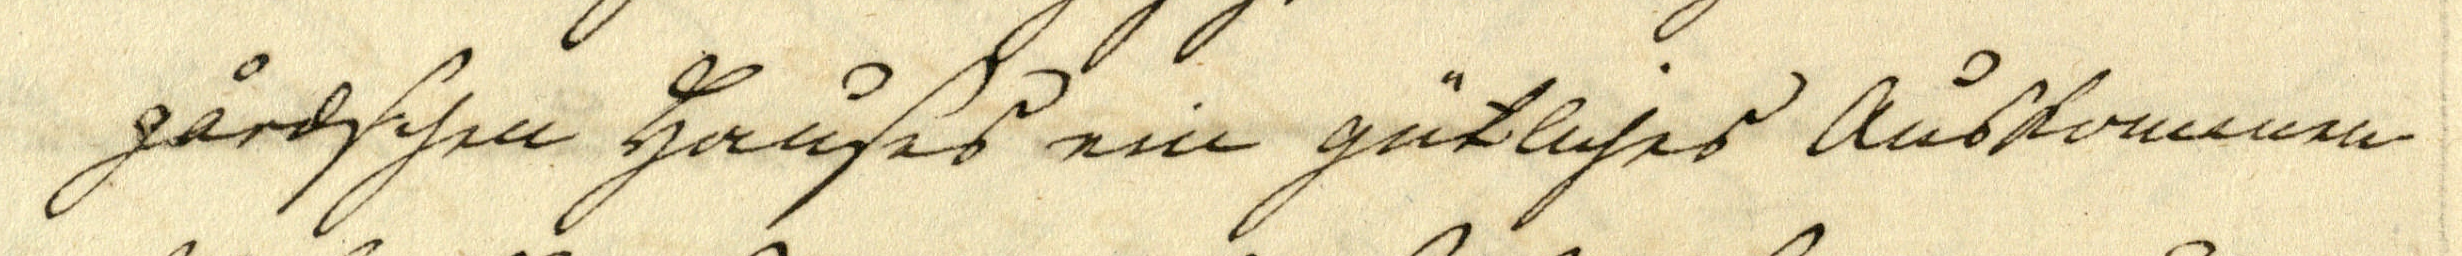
gårdschen Hauses ein gütliches Auskommen
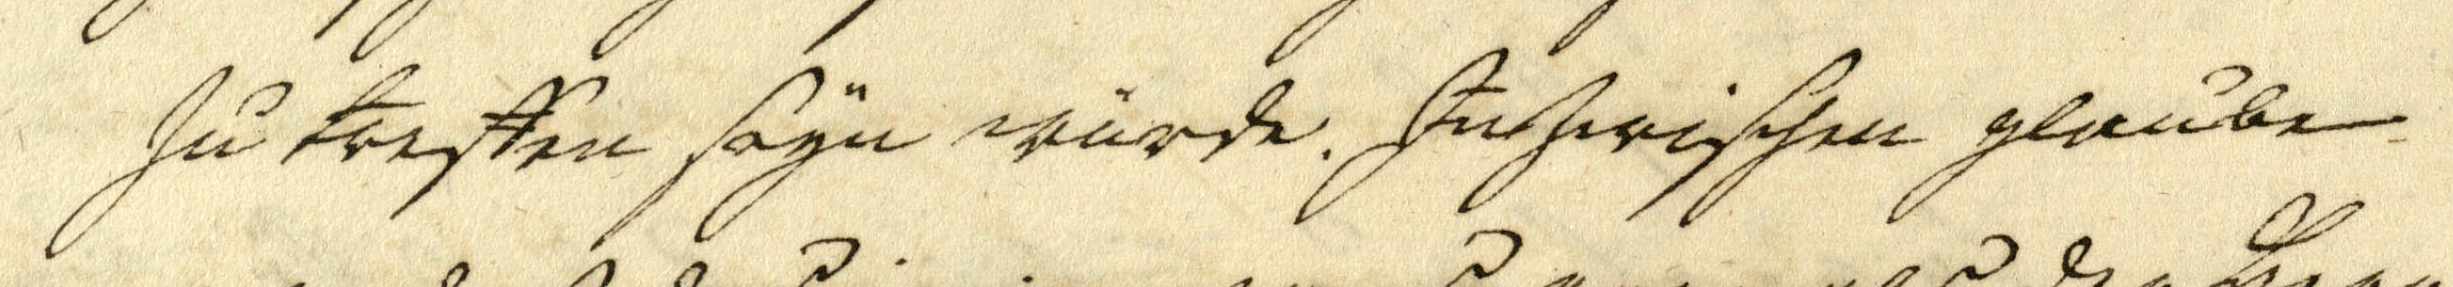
zu treffen seÿn würde. Inzwischen glaube
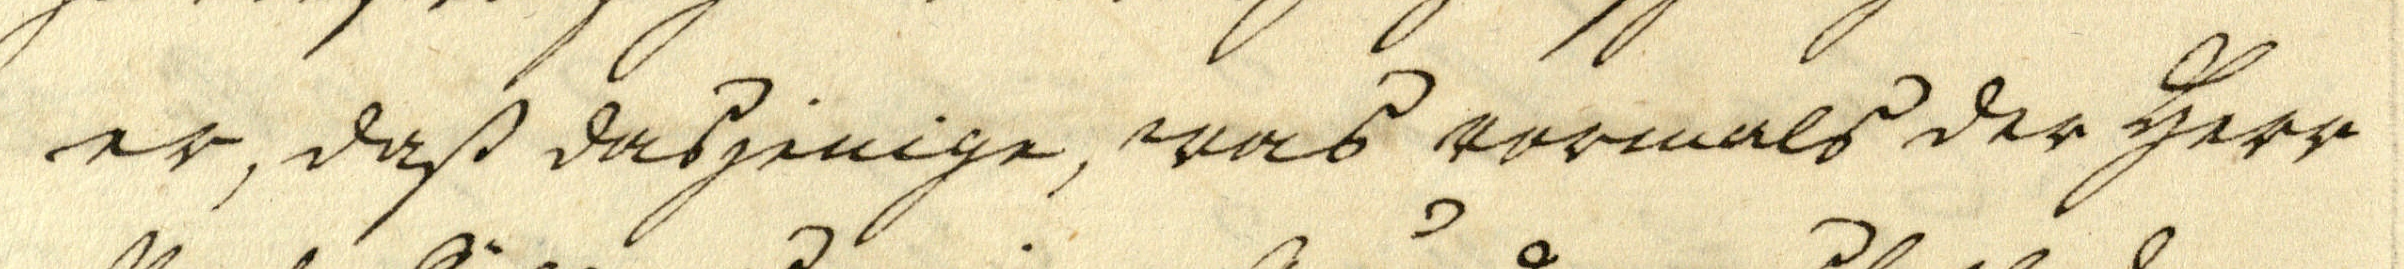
er, daß dasjenige, was vormals der Herr
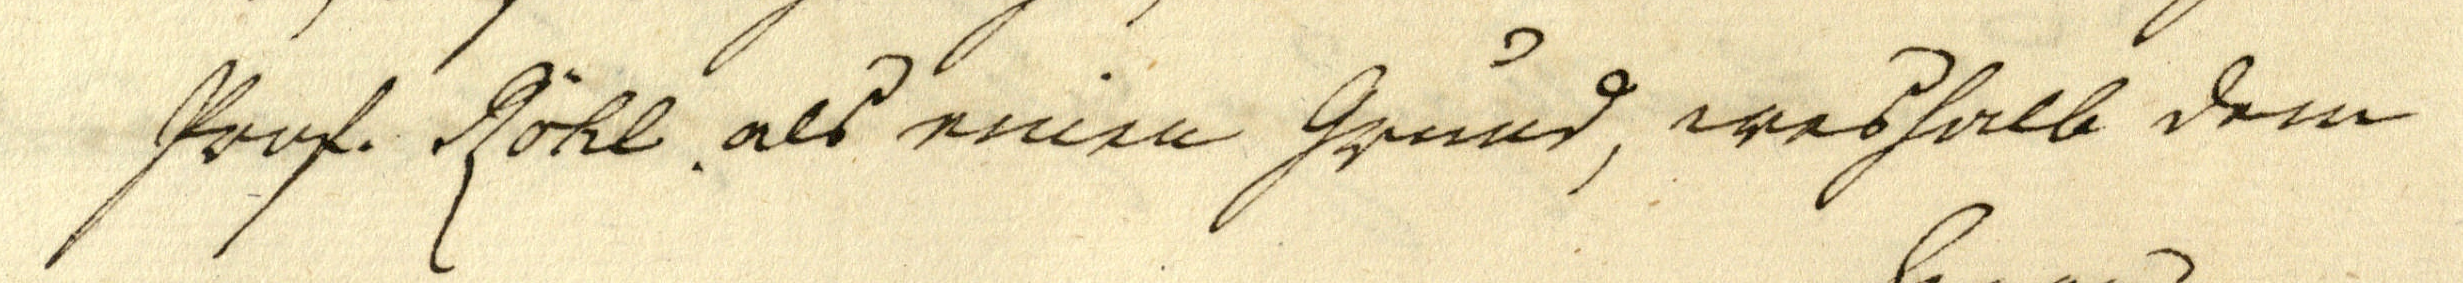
Prof. Röhl als einen Grund, weshalb dem
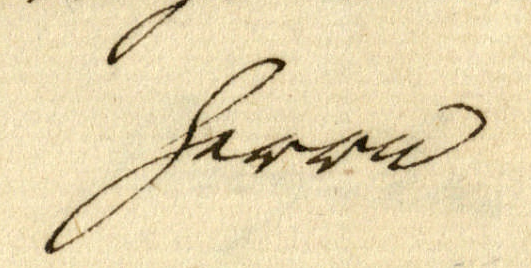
Herrn
